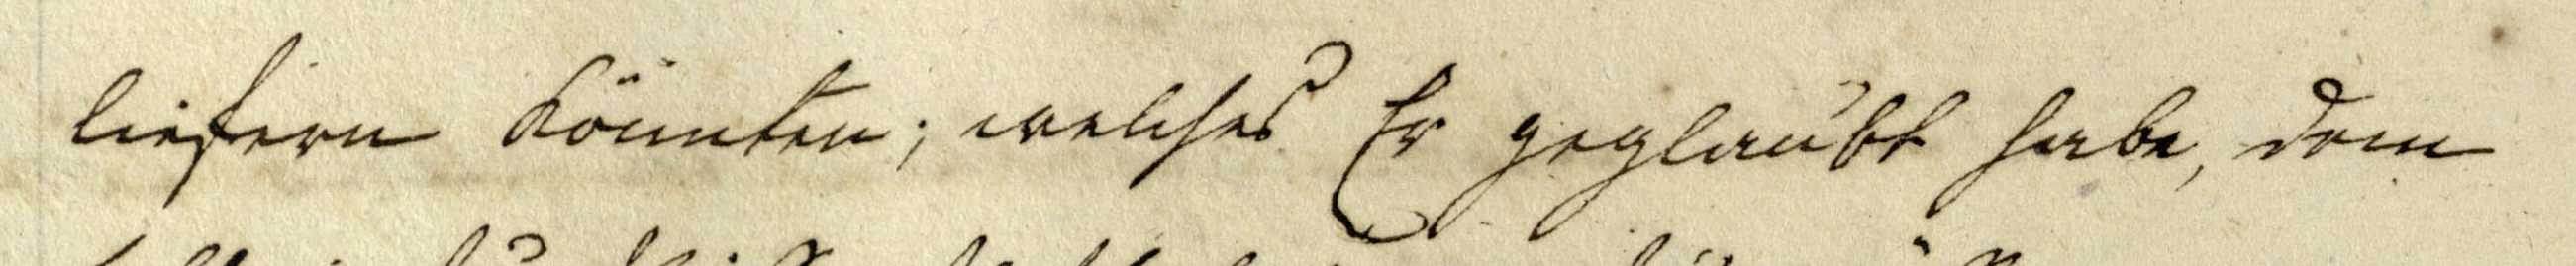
liefern könnten; welches Er geglaubt habe, dem
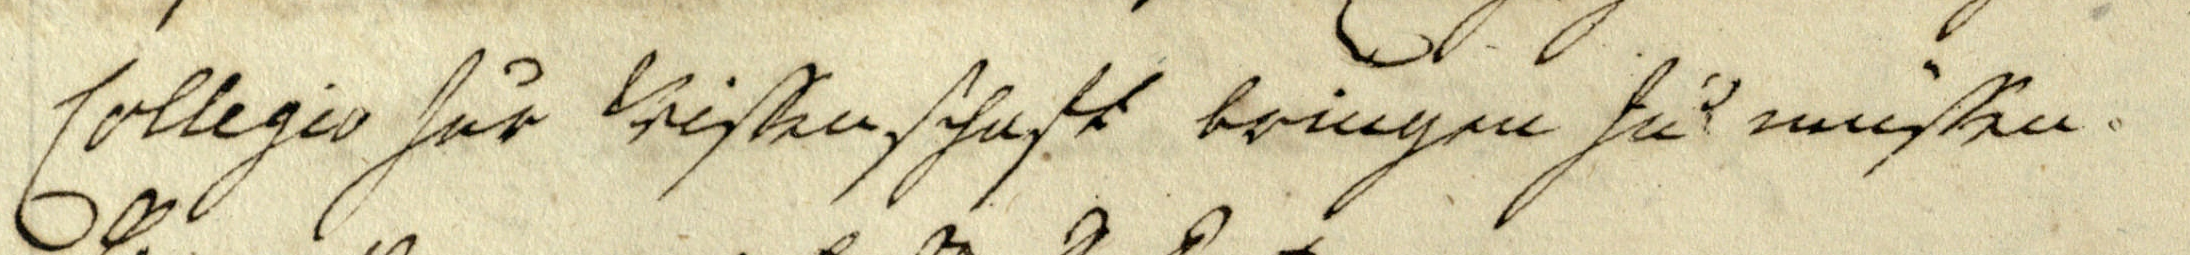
Collegio zur Wissenschaft bringen zu müssen.
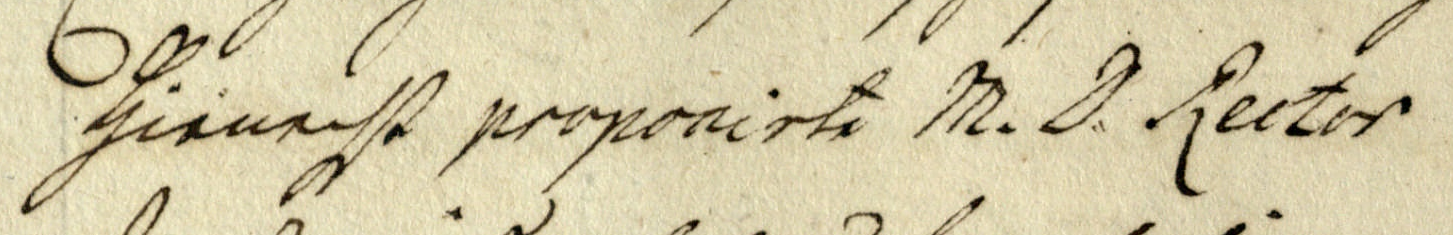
Hienechst proponirte M. D. Rector
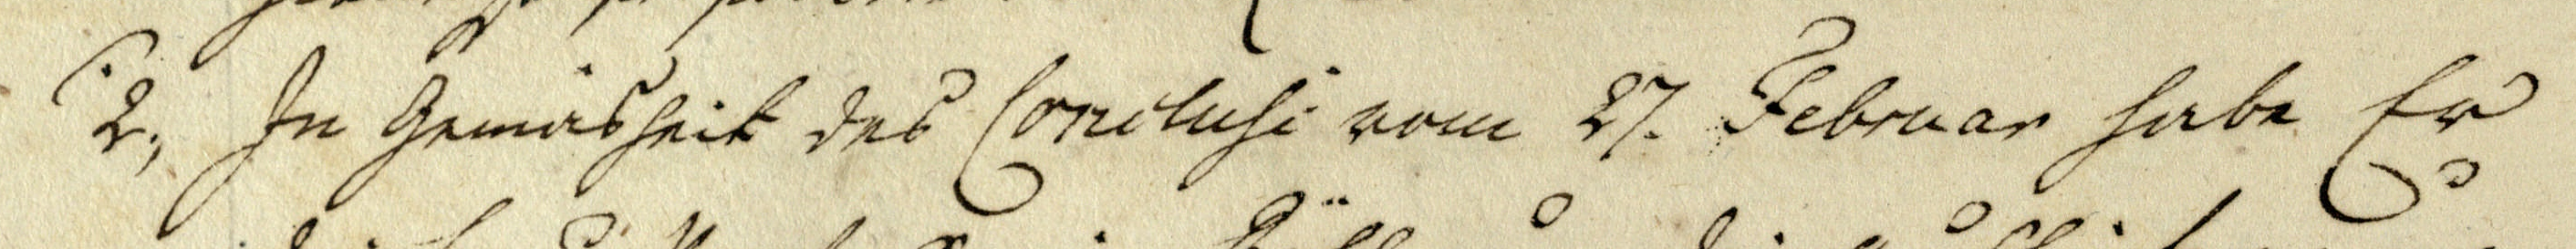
2., In Gemäsheit des Conclusi vom 27. Februar habe Er
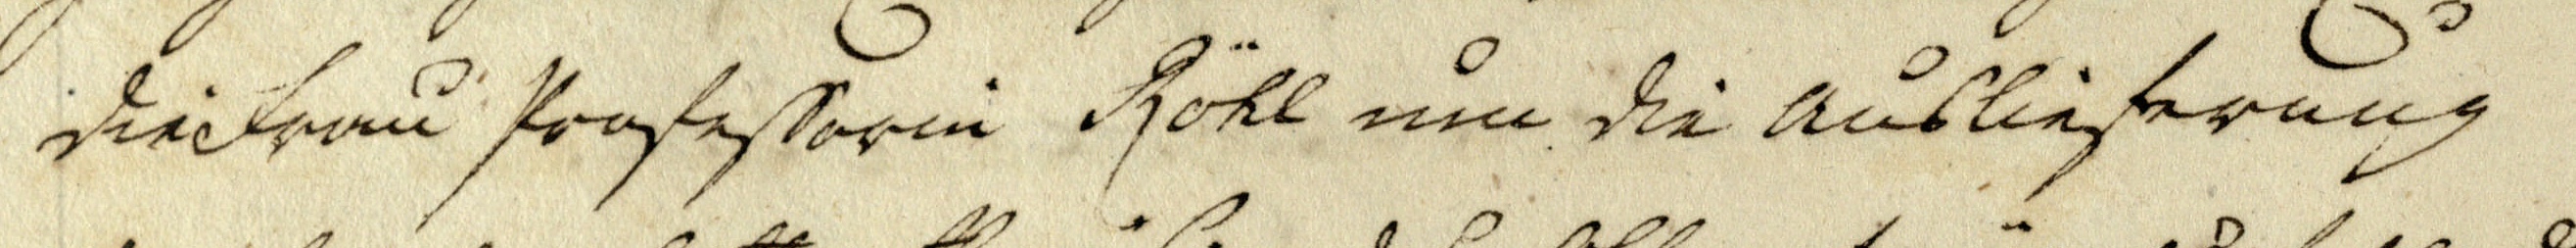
die Frau Professorin Röhl um die Auslieferung
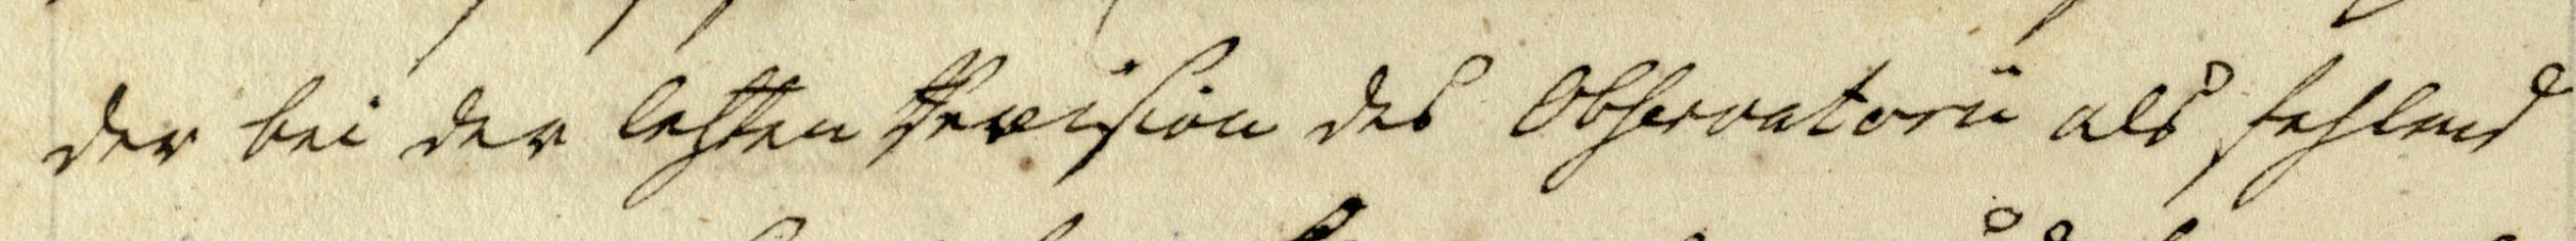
der bei der letzten Revision des Observatorii als fehlend
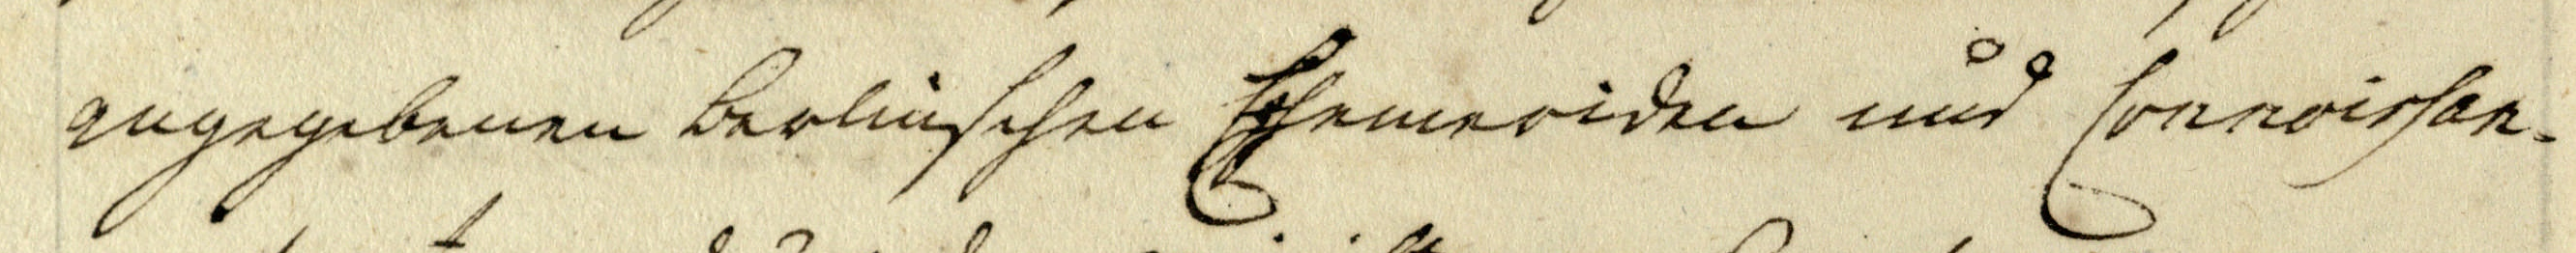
angegebenen Berlinschen Ephemeriden und Connaissan¬
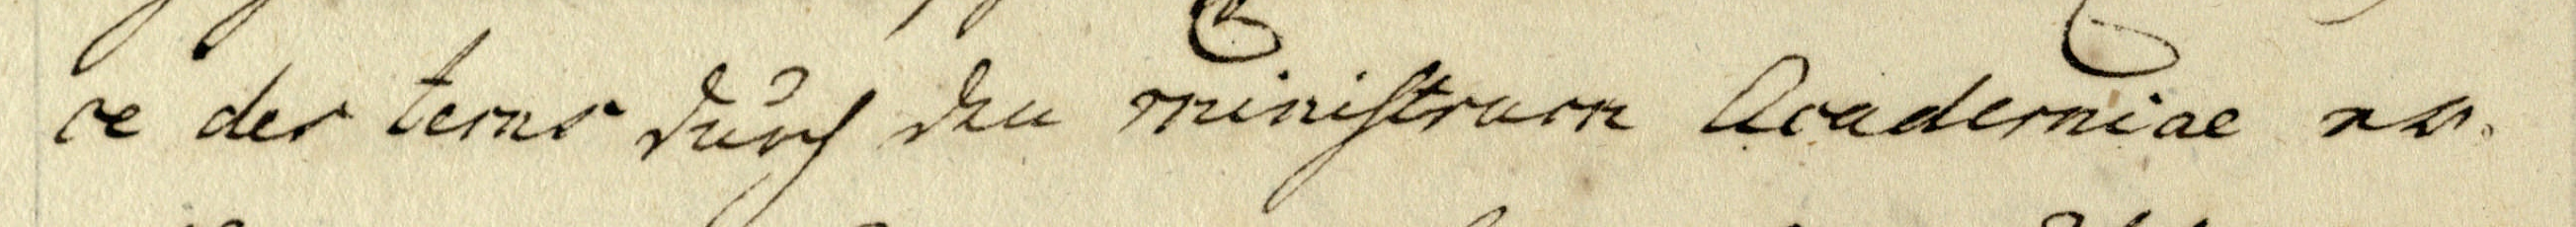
ce des tems durch den Ministrum Academiae er¬
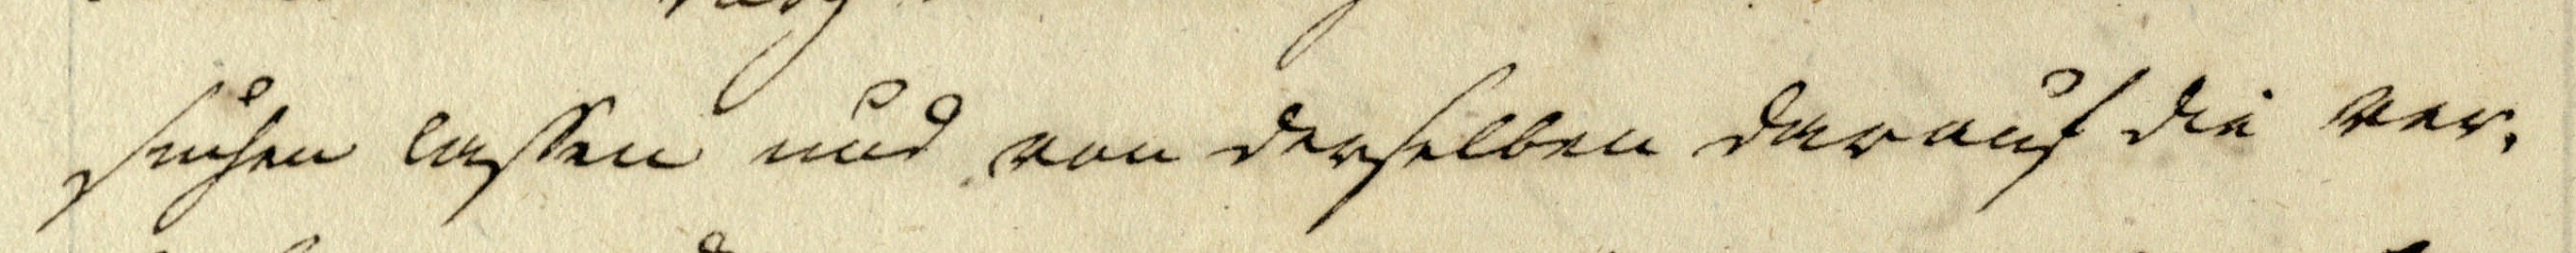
suchen lassen und von derselben darauf die ver¬
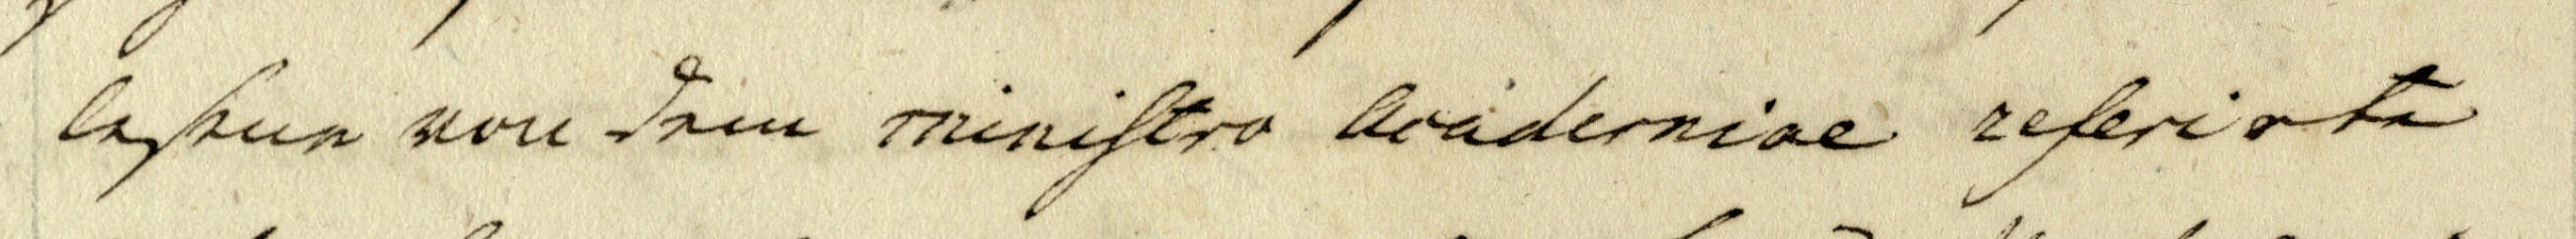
lesene von dem ministro Academiae referite
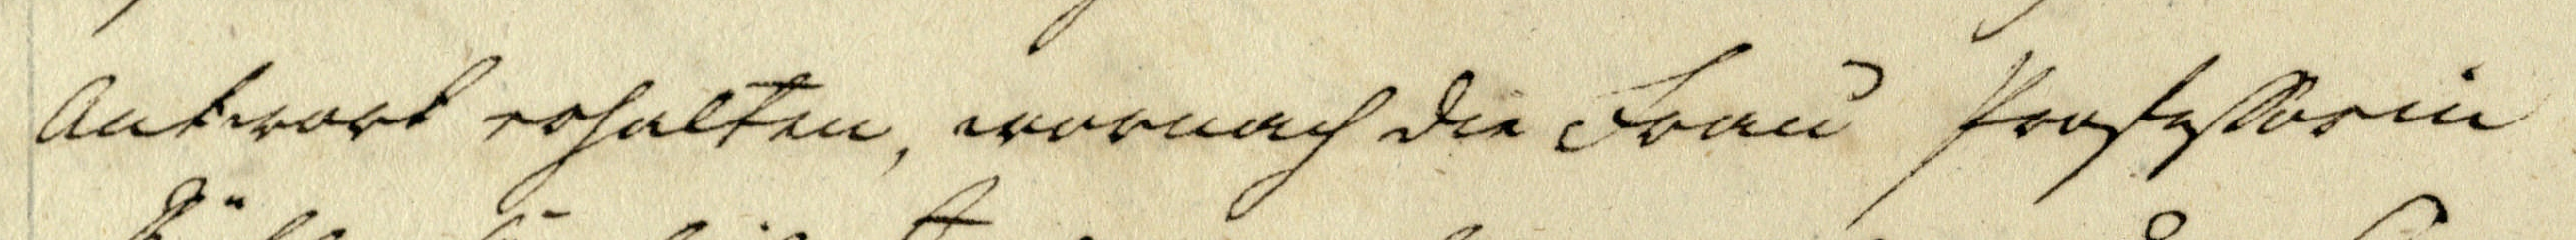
Antwort erhalten, wornach die Frau Professorin
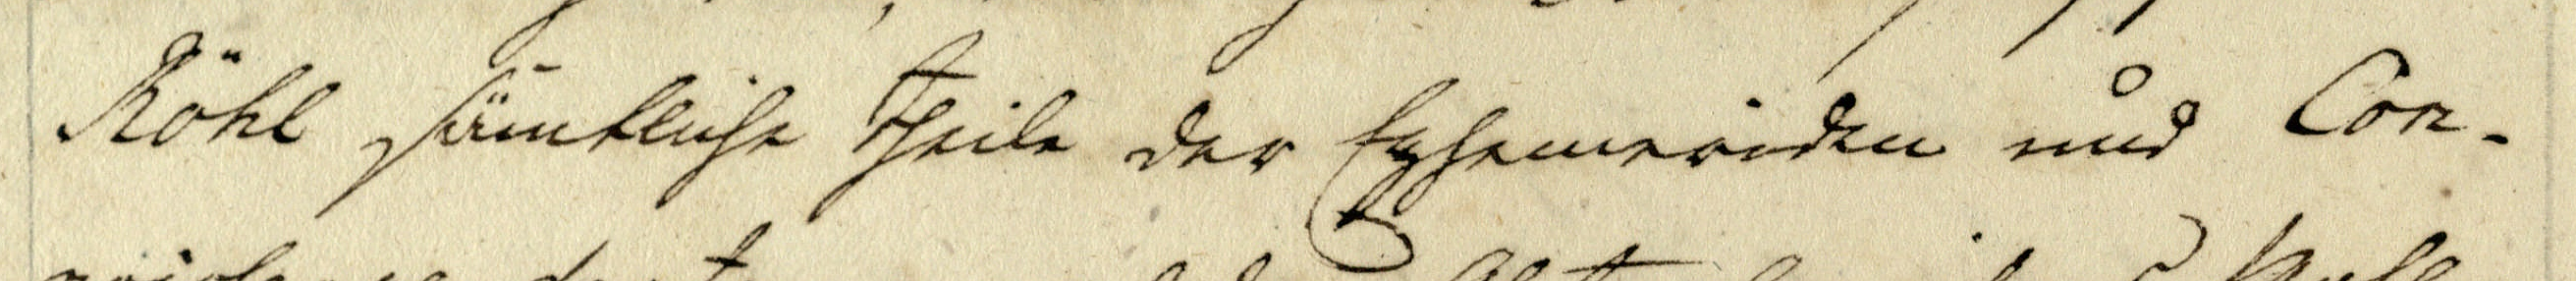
Röhl sämtliche Theile der Ephemeriden und Con¬
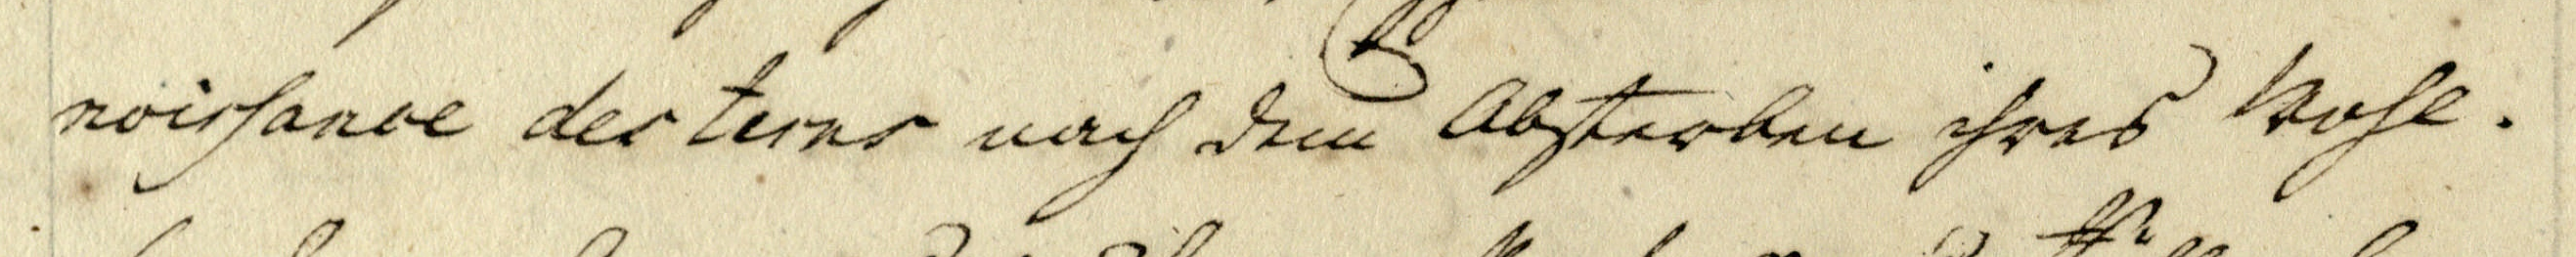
naissance des tems nach dem Absterben ihres Wohl¬
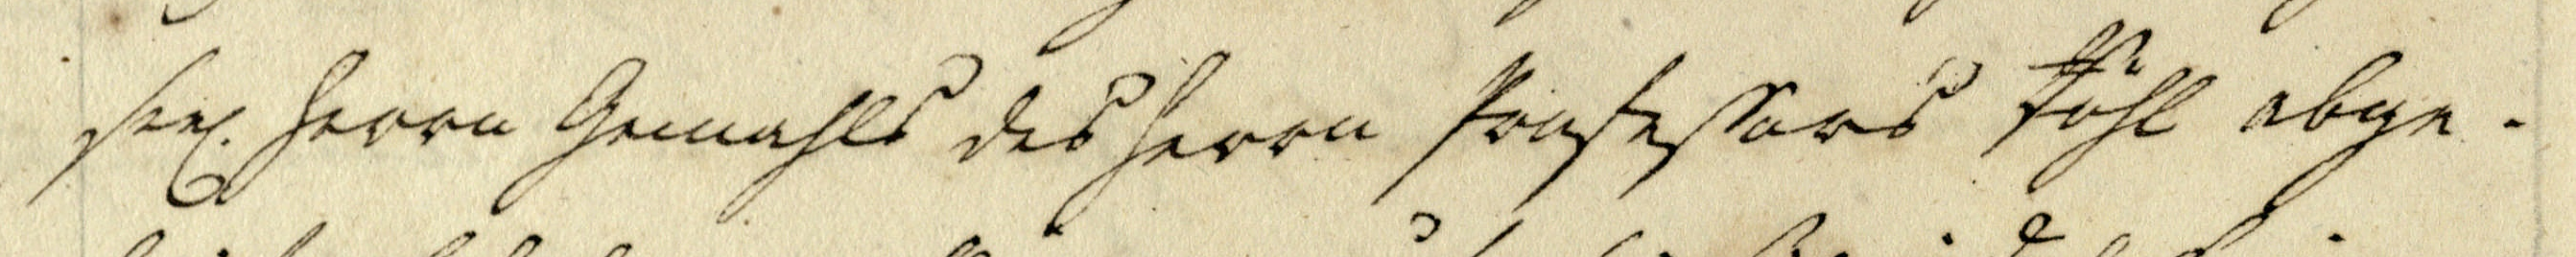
seel. Herrn Gemahls des Herrn Professors Röhl abge¬
